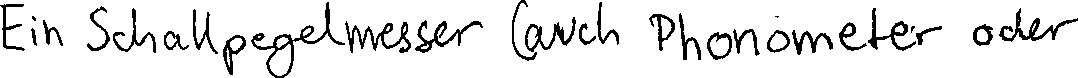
Ein Schallpegelmesser (auch Phonometer oder
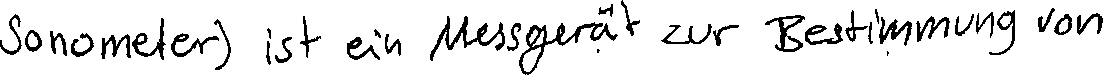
Sonometer) ist ein Messgerät zur Bestimmung von
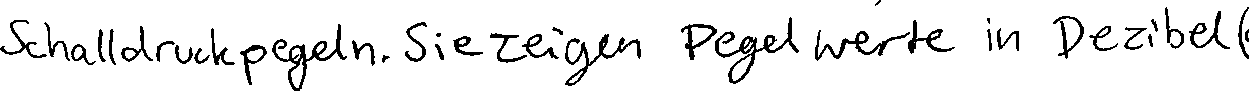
Schalldruckpegeln. Sie zeigen Pegelwerte in Dezibel (
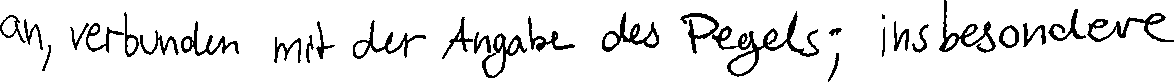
an, verbunden mit der Angabe des Pegels; insbesondere
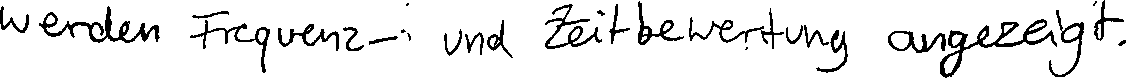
werden Frequenz- und Zeitbewertung angezeigt.
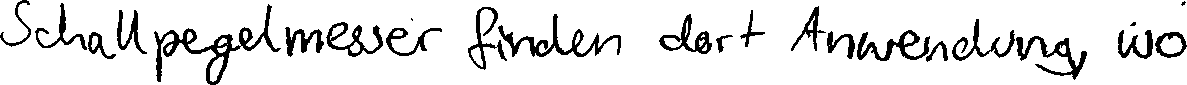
Schallpegelmesser finden dort Anwendung, wo
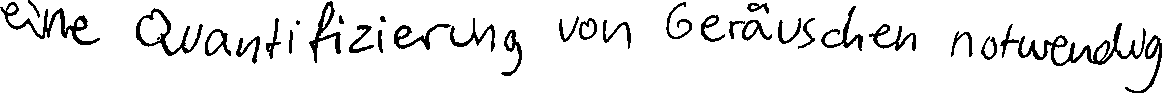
eine Quantifizierung von Geräuschen notwendig
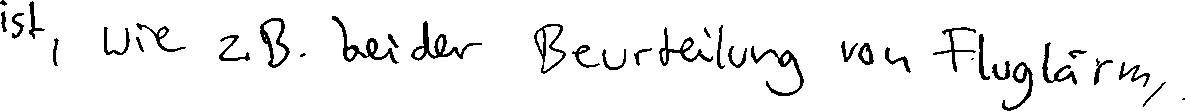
ist, wie z. B. bei der Beurteilung von Fluglärm,
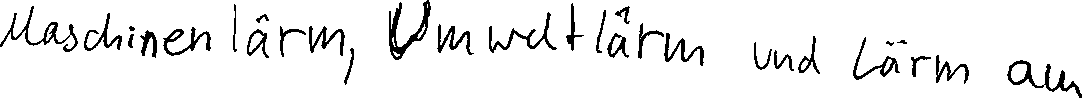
Maschinenlärm, Umweltlärm und Lärm am
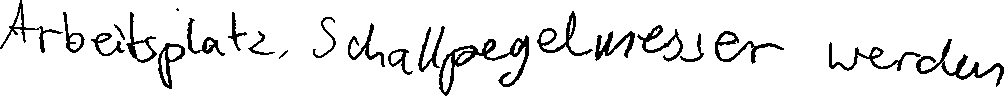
Arbeitsplatz. Schallpegelmesser werden
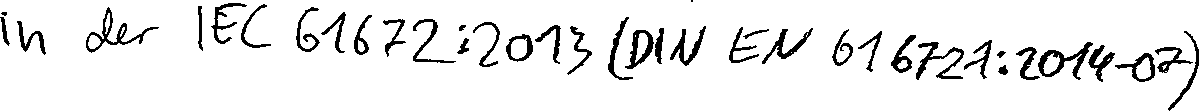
in der IEC 61672:2013 (DIN EN 61672-1:2014-07)
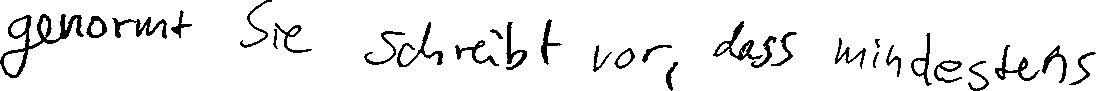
genormt. Sie schreibt vor, dass mindestens
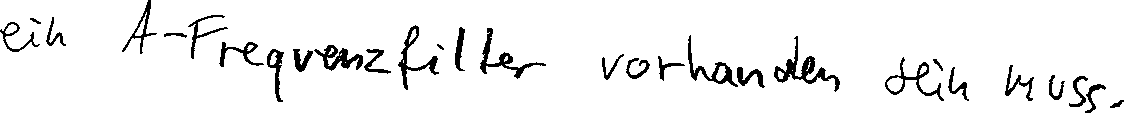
ein A-Frequenzfilter vorhanden sein muss.
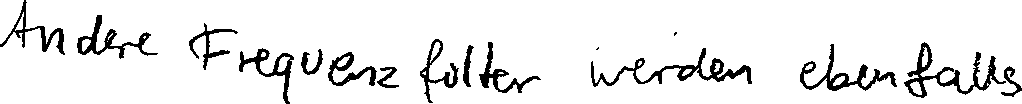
Andere Frequenzfilter werden ebenfalls
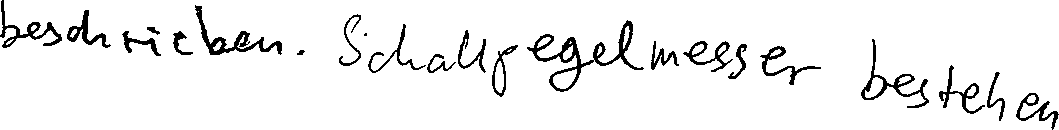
beschrieben. Schallpegelmesser bestehen
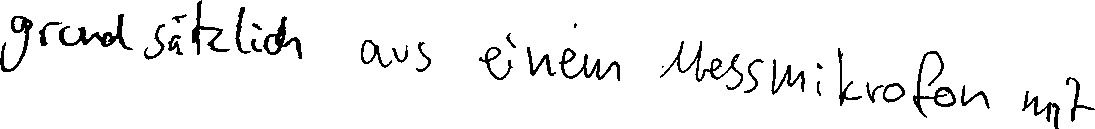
grundsätzlich aus einem Messmikrofon mit
